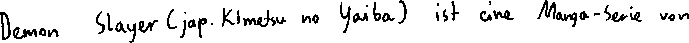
Demon Slayer (jap. Kimetsu no Yaiba) ist eine Manga-Serie von
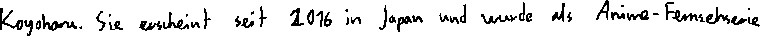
Koyoharu Sie erscheint seit 2016 in Japan und wurde als Anime-Fernsehserie
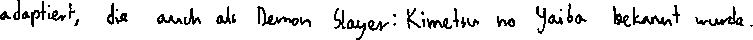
adaptiert, die auch als Demon Slayer: Kimetsu no Yaiba bekannt wurde.
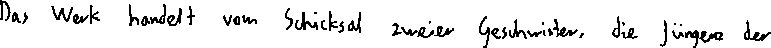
Das Werk handelt vom Schicksal zweier Geschwister, die Jüngere der
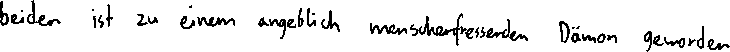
beiden ist zu einem angeblich menschenfressenden Dämon geworden
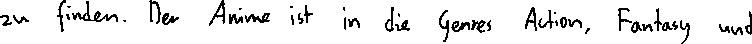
zu finden. Der Anime ist in die Genres Action, Fantasy und
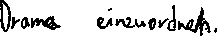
Drama einzuordnen.
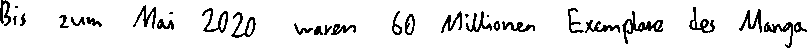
Bis zum Mai 2020 waren 60 Millionen Exemplare des Manga
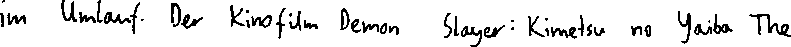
im Umlauf.Der Kinofilm Demon Slayer: Kimetsu no Yaiba The
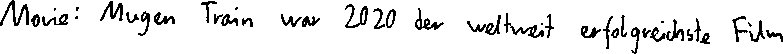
Movie: Mugen Train war 2020 der weltweit erfolgreichste Film
